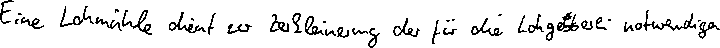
Eine Lohmühle dient zur Zerkleinerung der für die Lohgerberei notwendigen
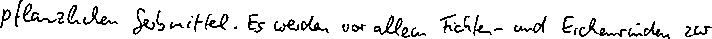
pflanzlichen Gerbmittel. Es werden vor allem Fichten- und Eichenrinden aus
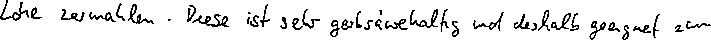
Lohe zermahlen. Diese ist sehr gerbsäurehaltig und deshalb geeignet zum
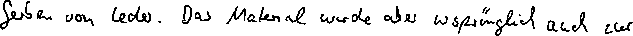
Gerben von Leder. Das Material wurde aber ursprünglich auch zur
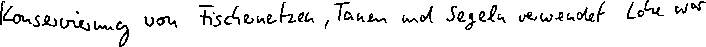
Konservierung von Fischernetzen, Tauen und Segeln verwendet. Lohe war
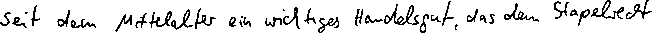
seit dem Mittelalter ein wichtiges Handelsgut, das dem Stapelrecht
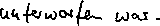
unterworfen war.
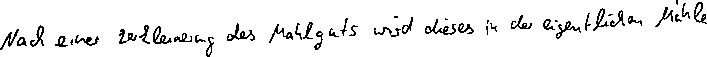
Nach einer Zerkleinerung des Mahlguts wird dieses in der eigentlichen Mühle
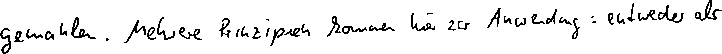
gemahlen. Mehrere Prinzipien kommen hier zur Anwendung: entweder als
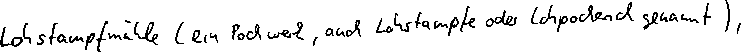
Lohstampfmühle (ein Pochwerk, auch Lohstampfe oder Lohpocherich genannt),
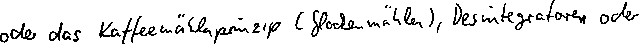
oder das Kaffeemühlenprinzip (Glockenmühlen), Desintegratoren oder
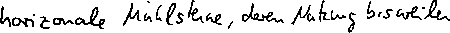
horizontale Mühlsteine, deren Nutzung bisweilen
